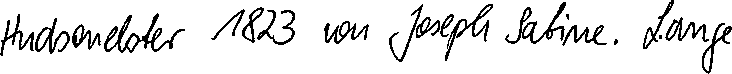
Hudsonelster 1823 von Joseph Sabine. Lange
